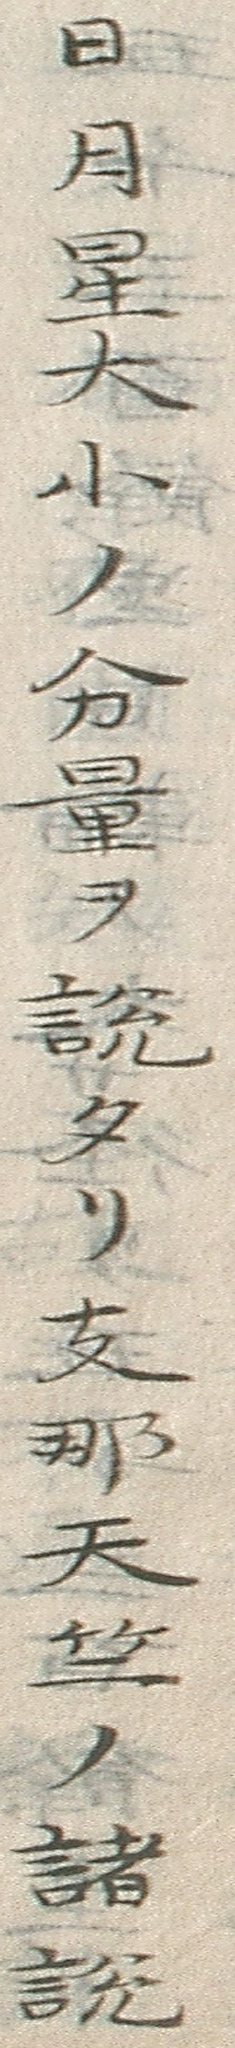日月星大小ノ分量ヲ説タリ支那天竺ノ諸説
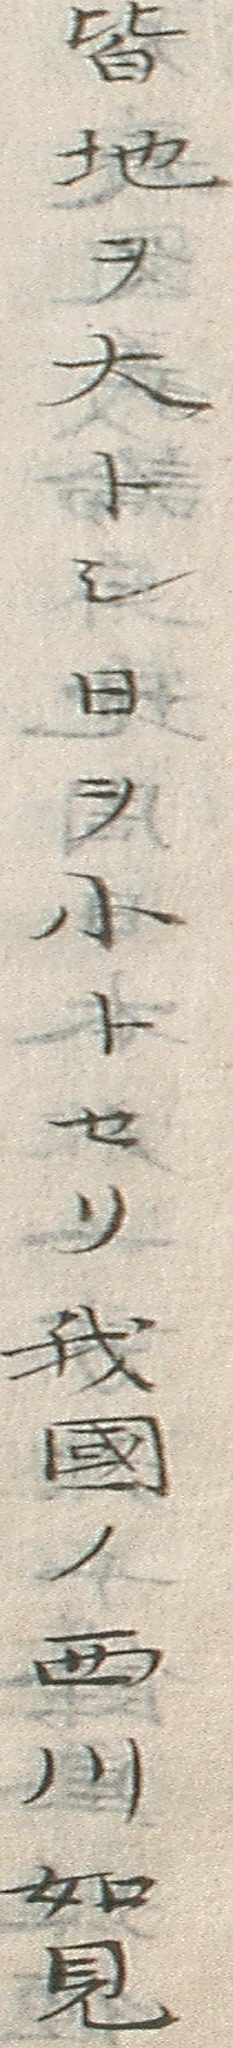皆地ヲ大トシ日ヲ小トセリ我国ノ西川如見

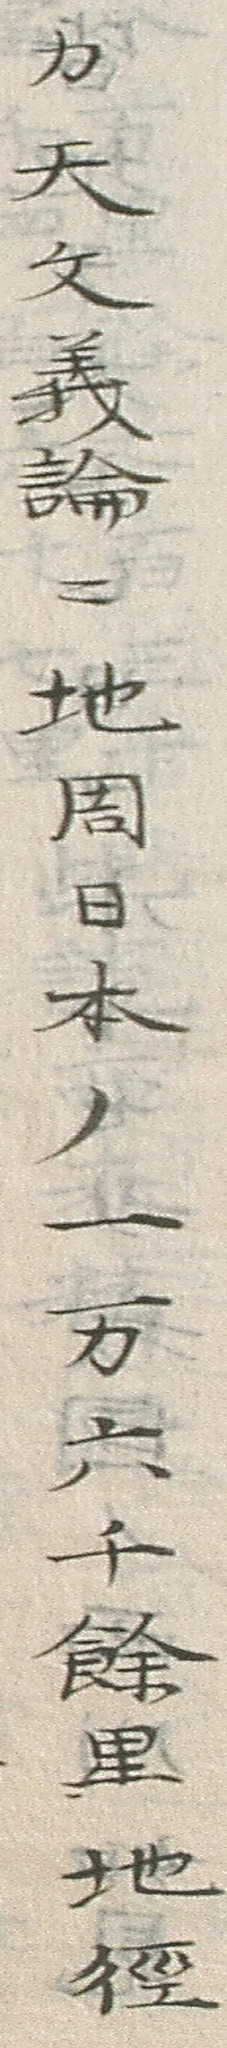カ天文義論ニ地周日本ノ一万六千余里地径
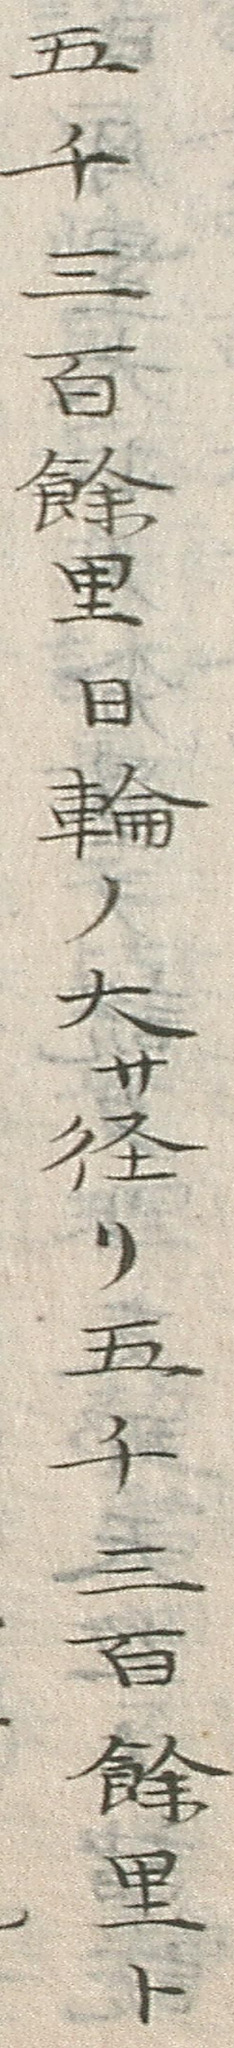五千三百余里日輪ノ大サ径リ五千三百余里ト
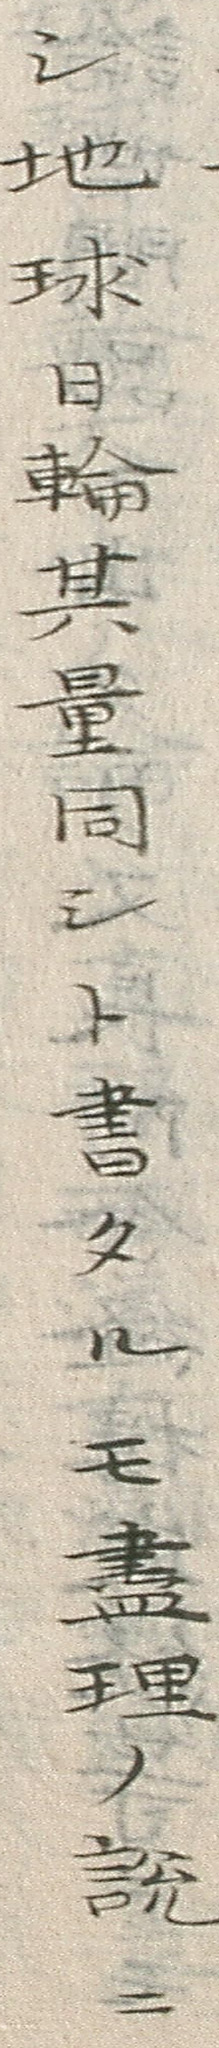シ地球日輪其量同シト書タルモ尽理ノ説ニ
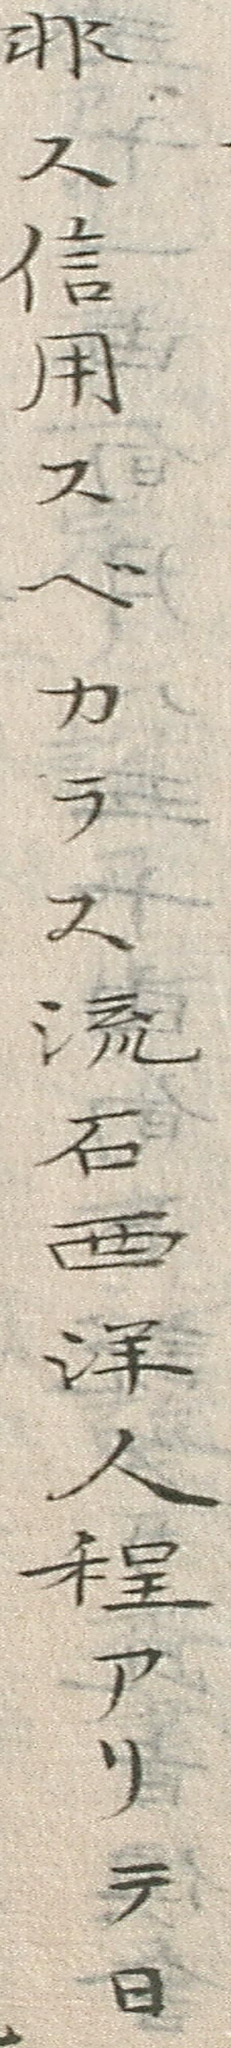非ス信用スベカラス流石西洋人程アリテ日
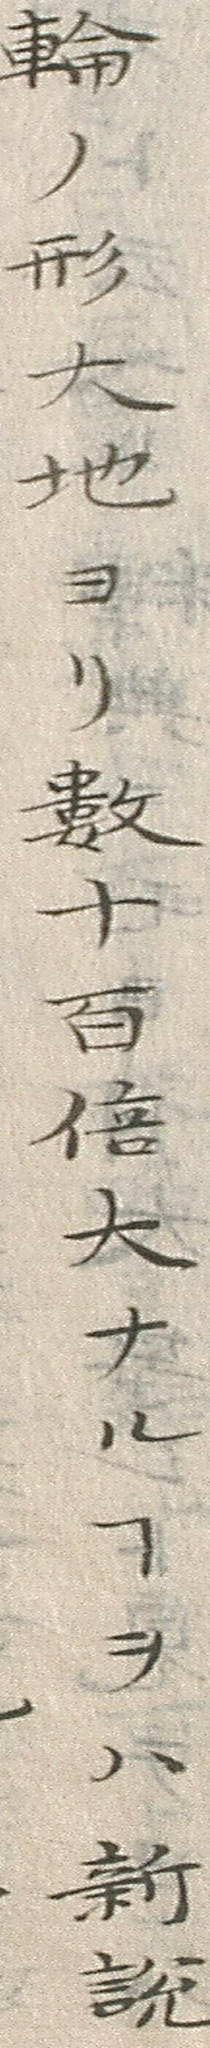輪ノ形大地ヨリ数十百倍大ナルコトヲハ新説
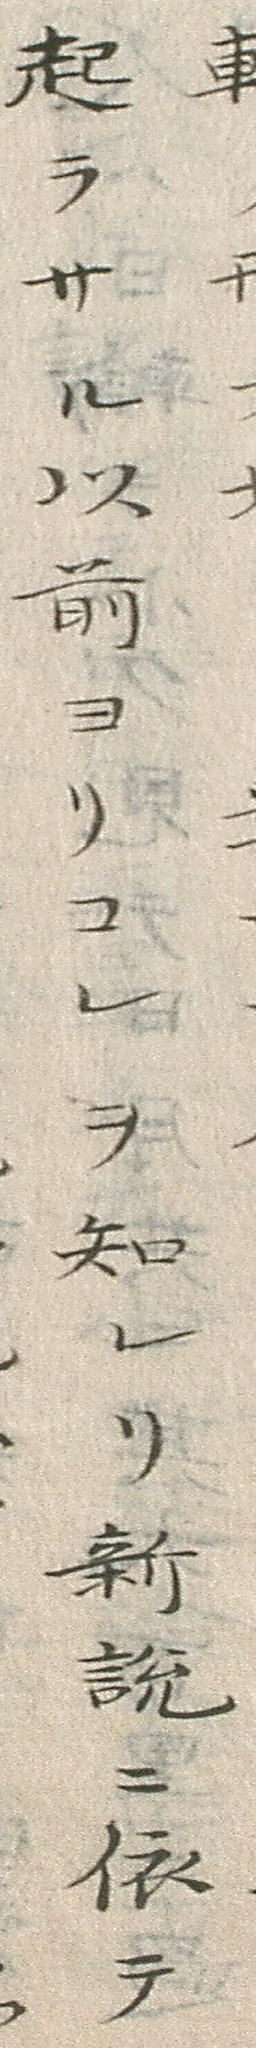起ラサル以前ヨリコレヲ知レリ新説ニ依テ
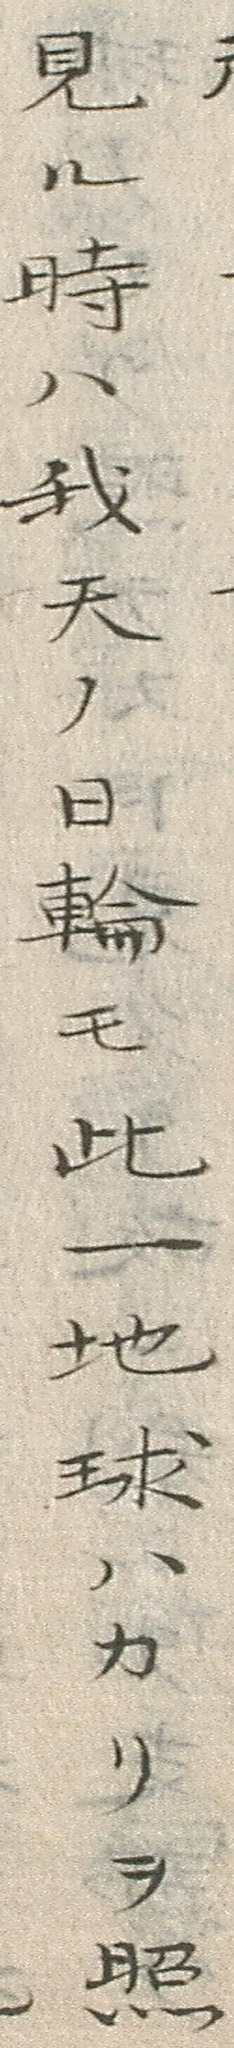見ル時ハ我天ノ日輪モ此一地球ハカリヲ照
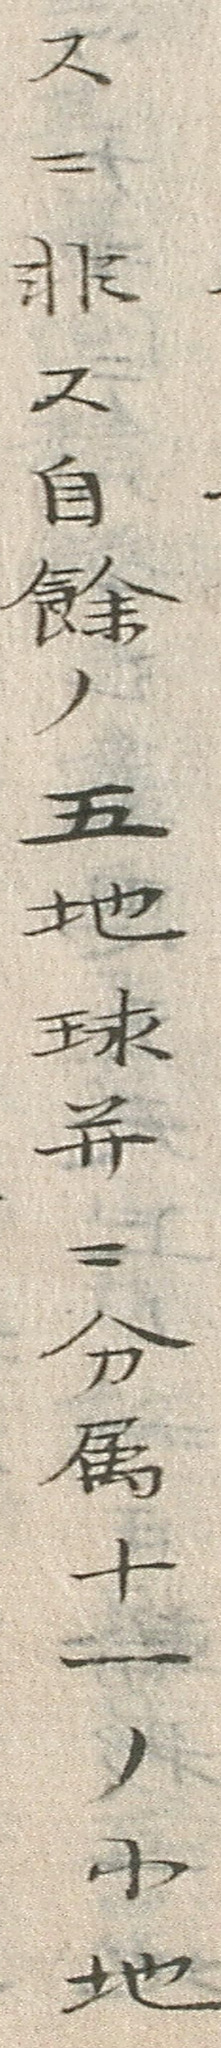スニ非ス自余ノ五地球并ニ分属十一ノ小地
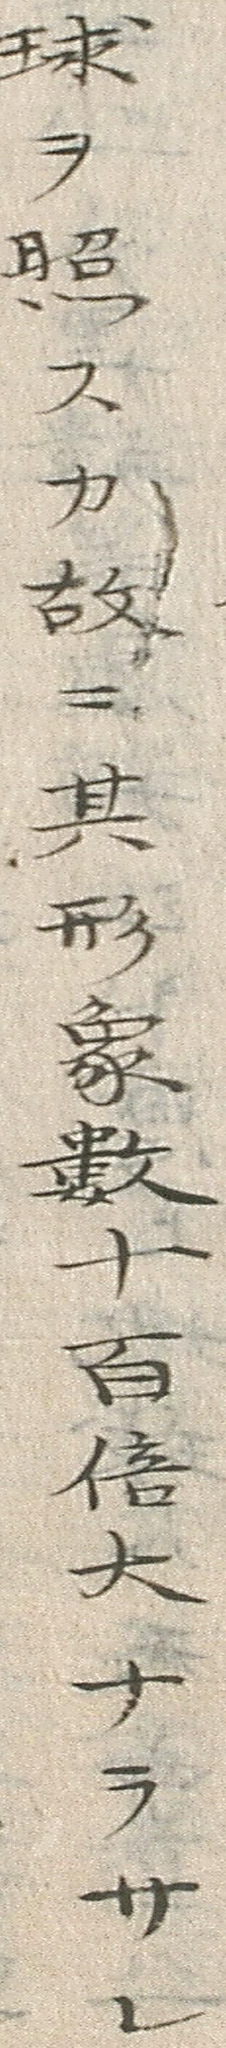球ヲ照スカ故ニ其形象数十百倍大ナラサレ
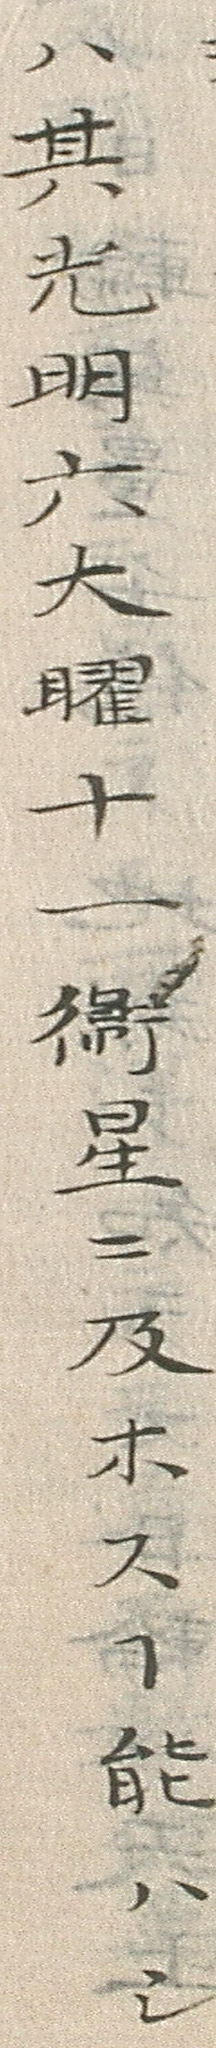ハ其光明六大曜十一衛星ニ及ホスコト能ハシ
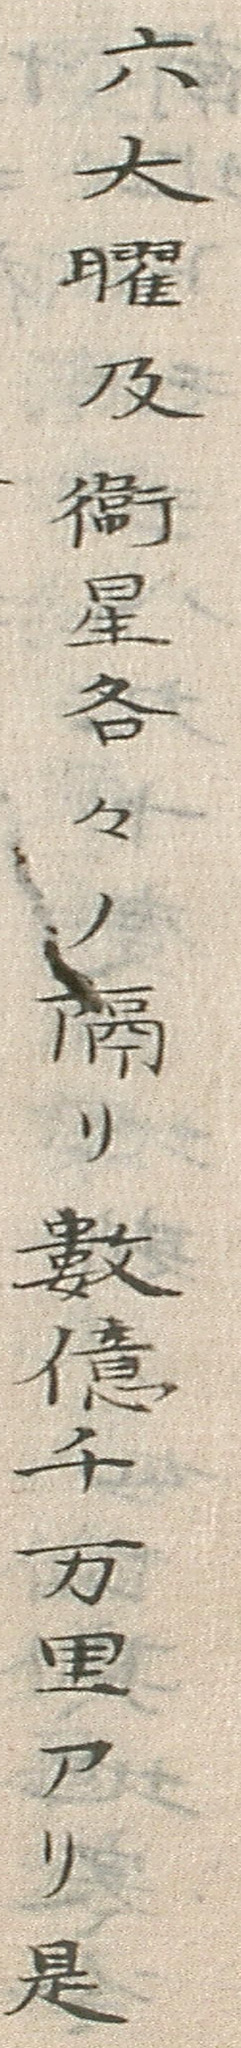六大曜及衛星各々ノ隔リ数億千万里アリ是
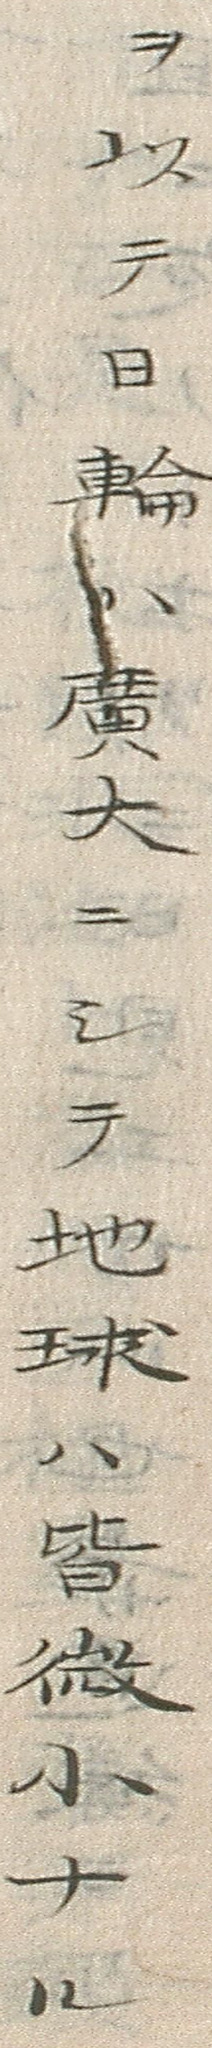ヲ以テ日輪ハ広大ニシテ地球ハ皆微小ナル
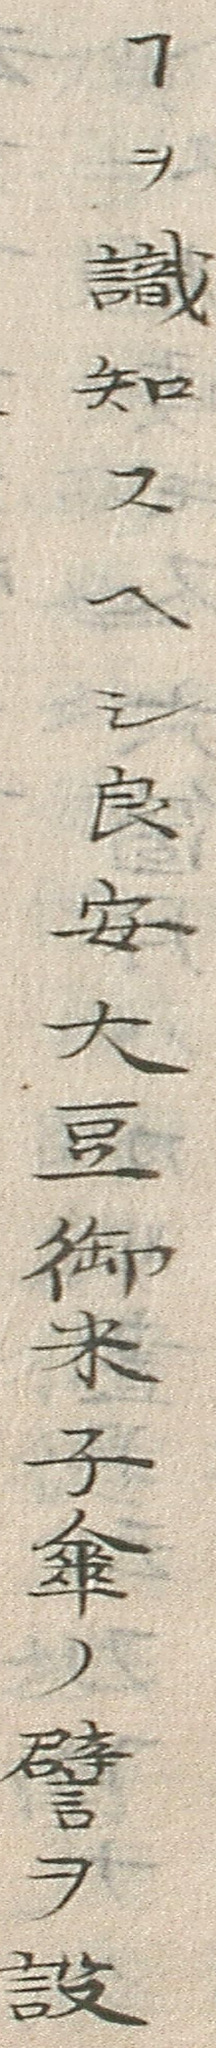コトヲ識知スヘシ良安大豆御米子傘ノ譬ヲ設
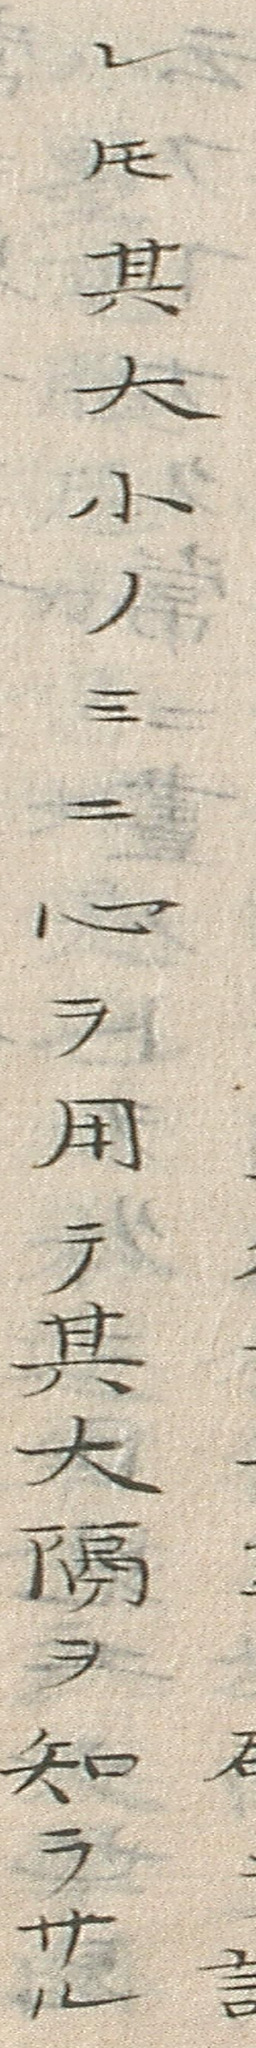レトモ其大小ノミニ心ヲ用テ其大隔ヲ知ラサル
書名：天學略名目羽翼　全
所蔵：東京大学地震研究所図書室 Earthquake Research Institute Library, The University of Tokyo, JAPAN
